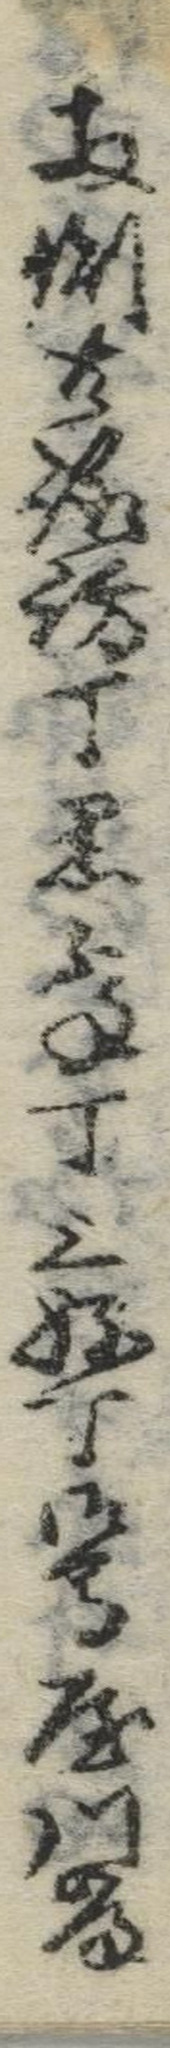両側共諏訪丁黑ふね丁三好丁御馬屋川岸
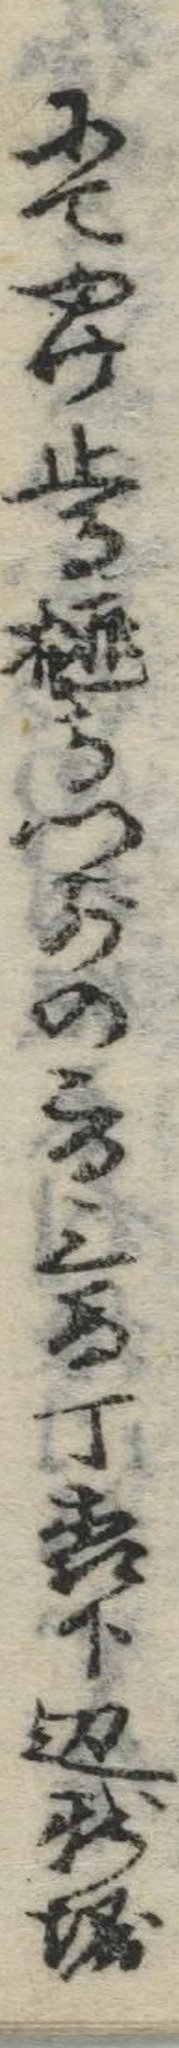にて焼止る榧寺門前のこる三番丁森下辺新堀
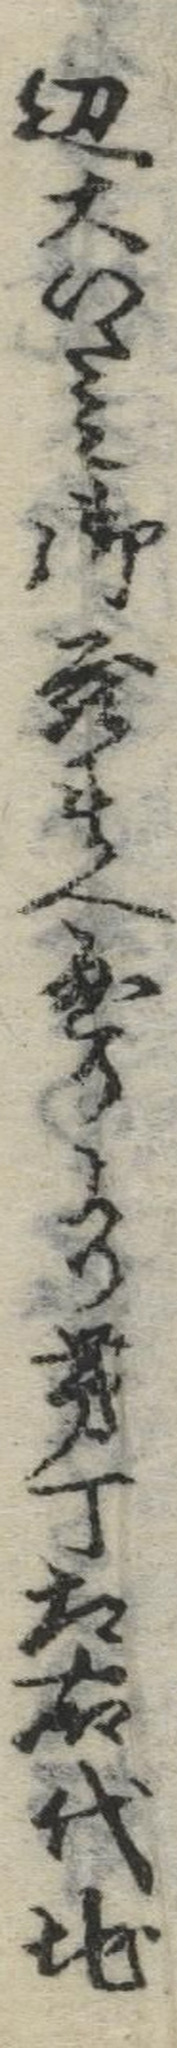辺大いたミ御蔵まへ通りより茅丁左右代地
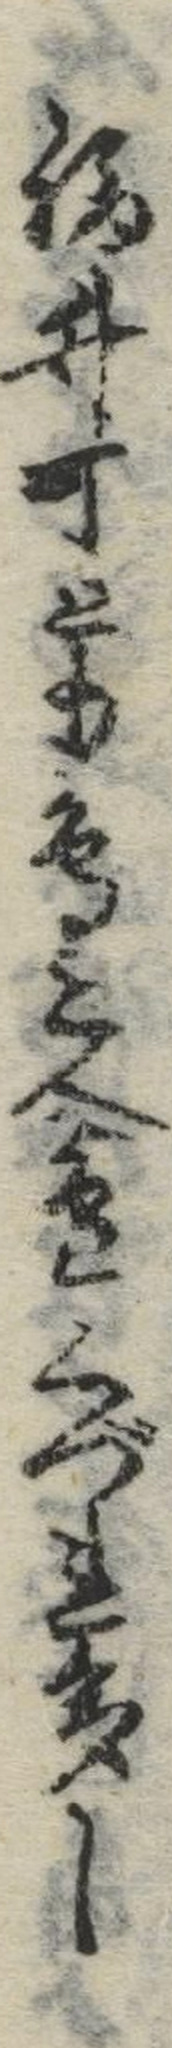福井丁ともとりこへ辺くづれ多し
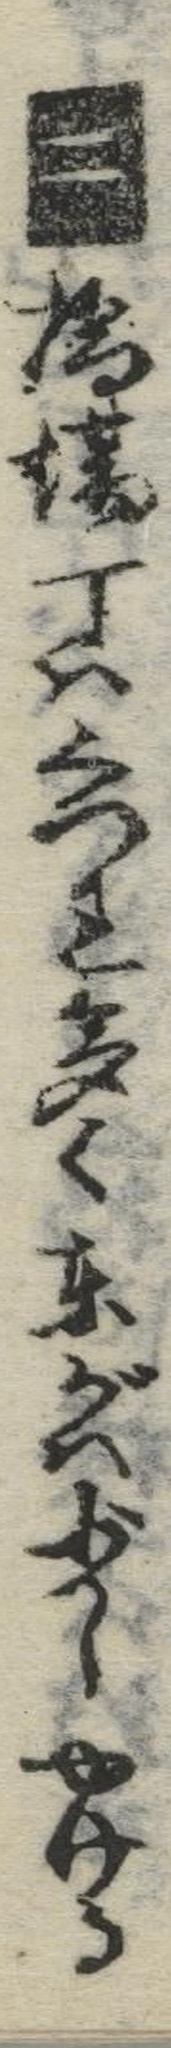二橋場丁ハくづれ多く東がハ少しやける
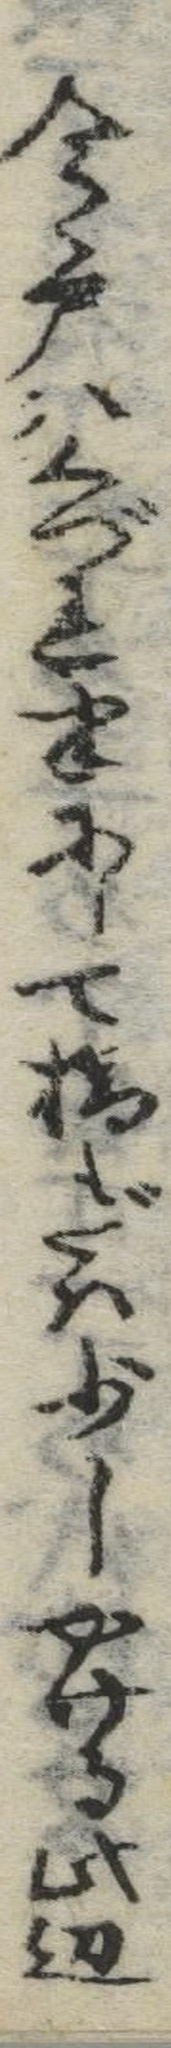今戸ハくづれ半にして橋がハ少しやける此辺
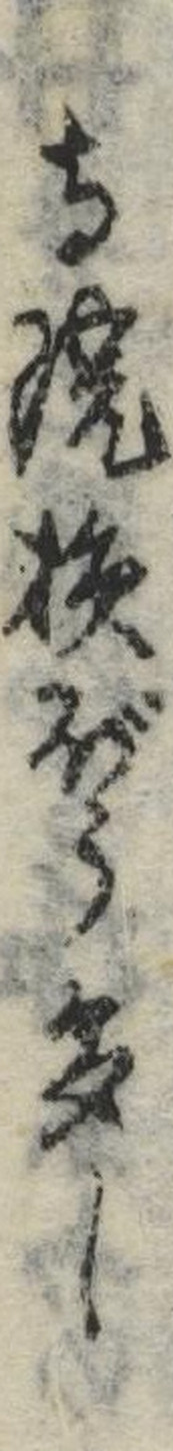寺院損ぼう多し
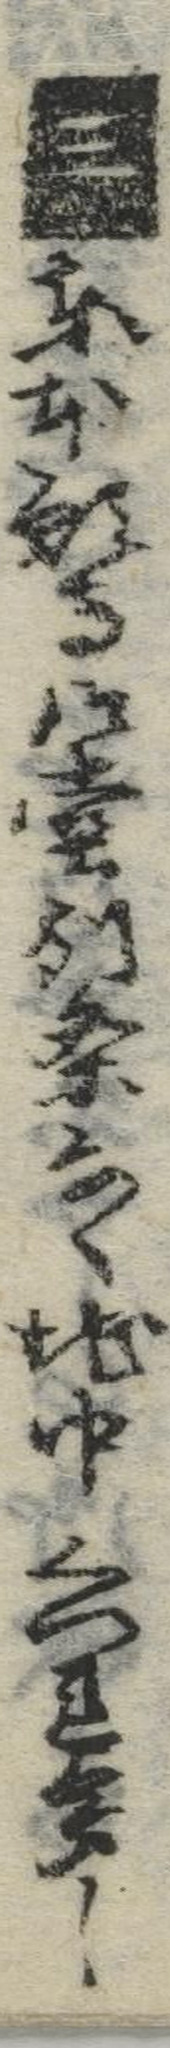三東本願寺御堂別条なく地中くづれ多し
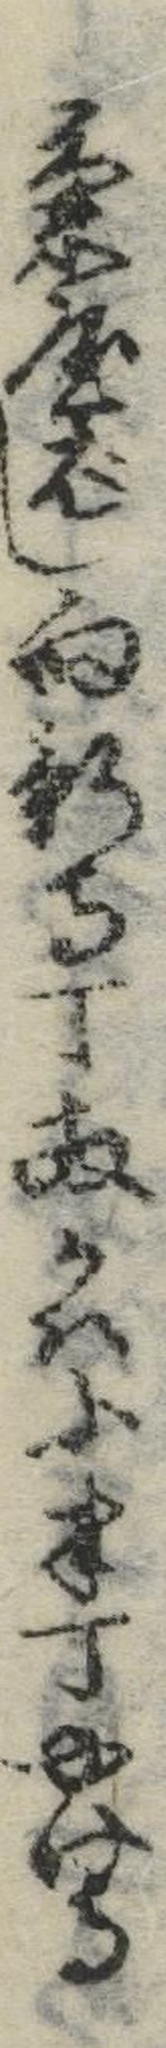茶屋ばし向新寺丁両かハ小半丁やける
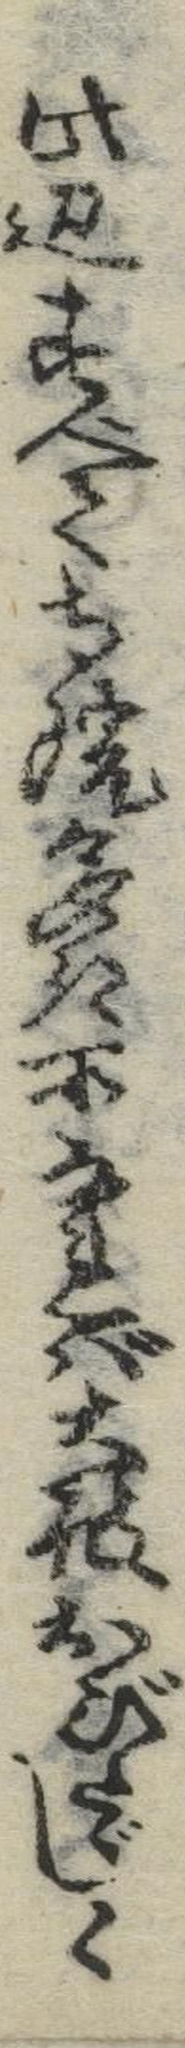此の辺すべて寺院多きところなれバ大破おびたゞしく
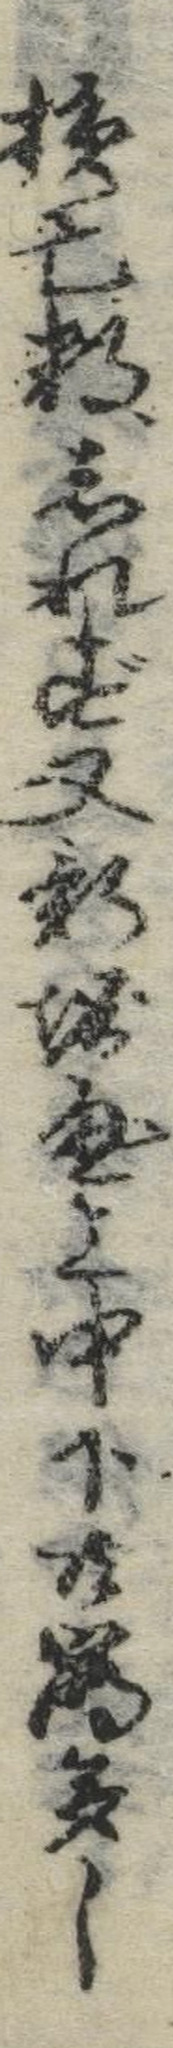損亡数しれず又新堀通上中下共崩多し
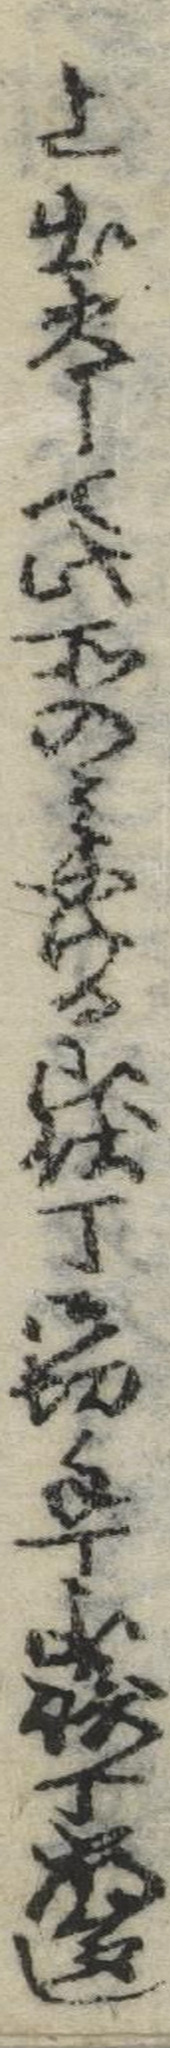上出火して此所のミやける山伏丁御切手丁山崎丁崩多し
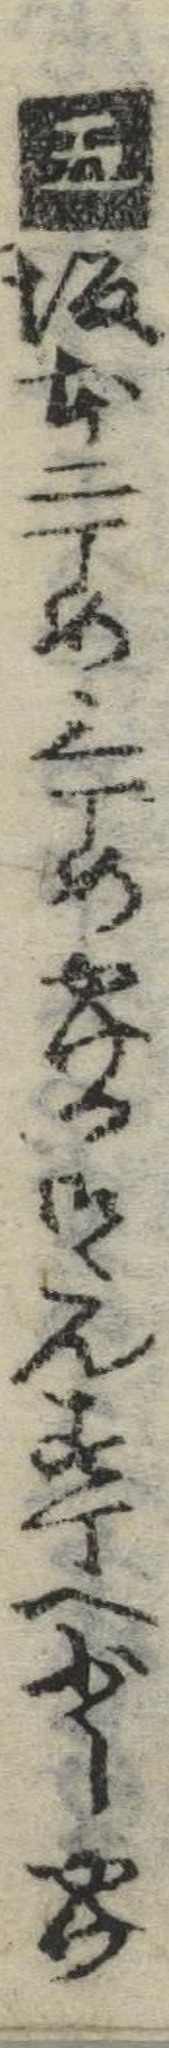五坂本二丁め三丁めやける御たんす丁へ少しやけ
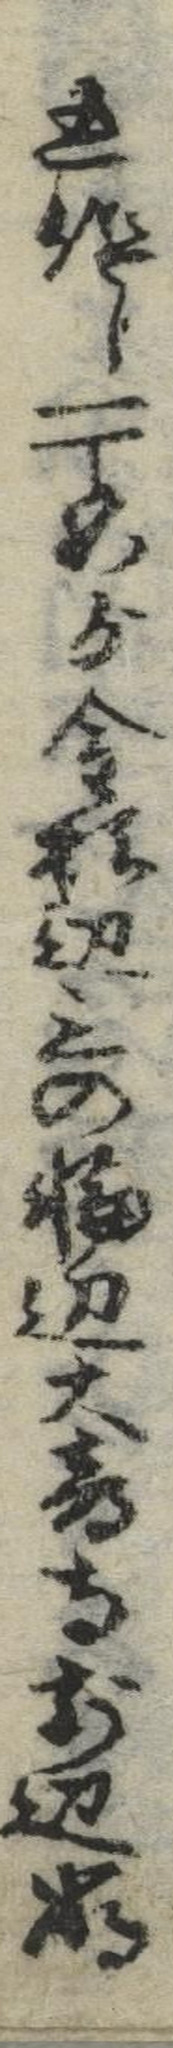込じ一丁めゟ金杉辺三の輪辺大音寺前辺崩
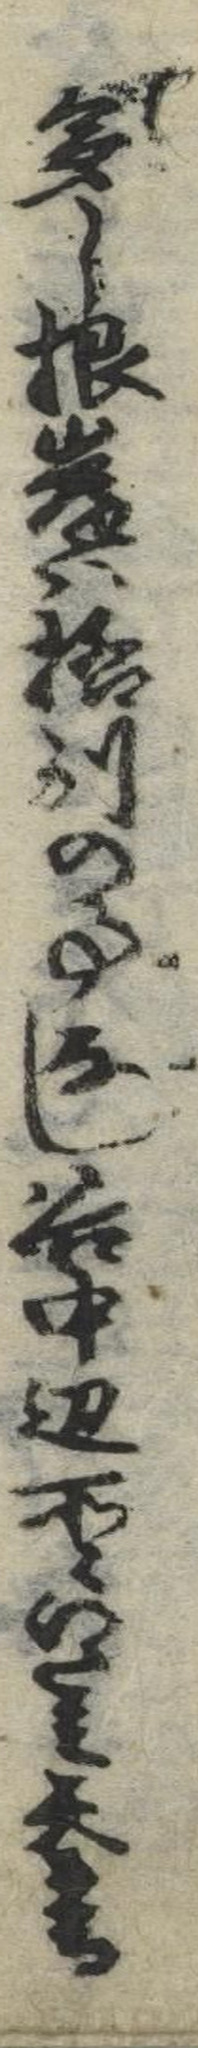多し根岸ハ格別の事なし谷中辺所々いたミ天王寺

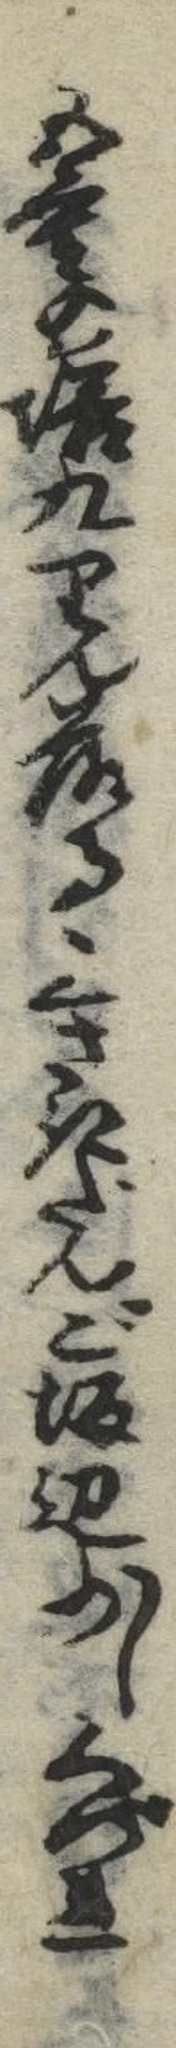五重の塔九りん落る三さきたんご坂辺少しくづれ
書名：安政二卯十月二日夜四ツ時過　御府内御屋敷方市中共　地震類焼場所明細書之寫　并街道筋近郷聞書
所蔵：東京大学地震研究所図書室 Earthquake Research Institute Library, The University of Tokyo, JAPAN
